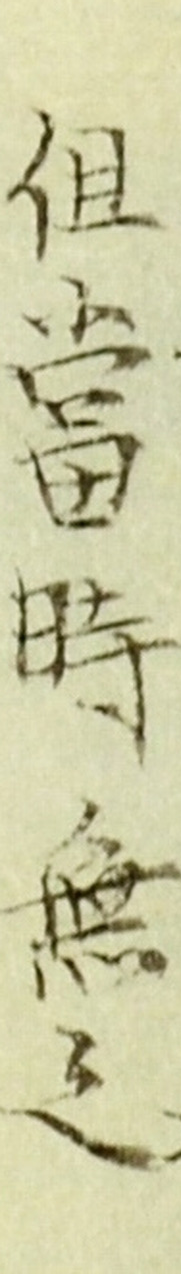但当時無之
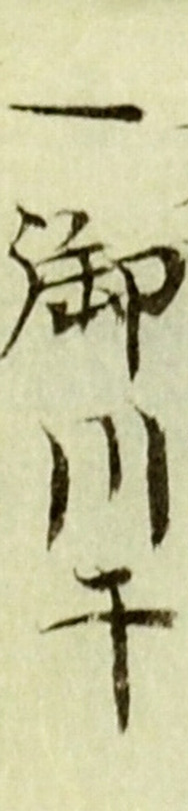一御川干
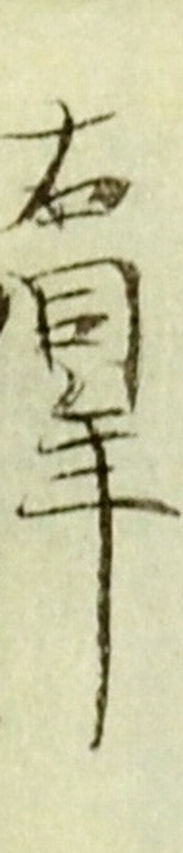右同年
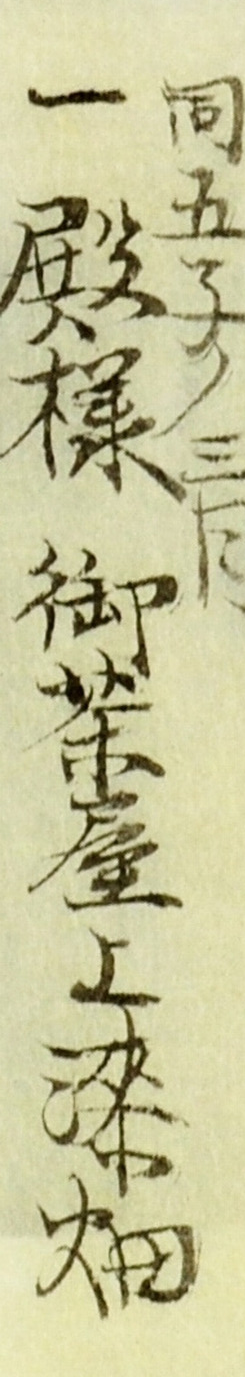一殿様御茶屋上漆畑
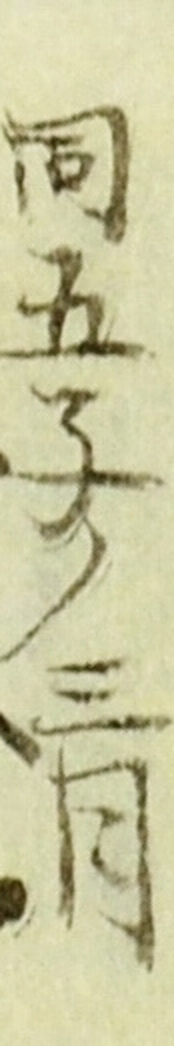同五子ノ三月
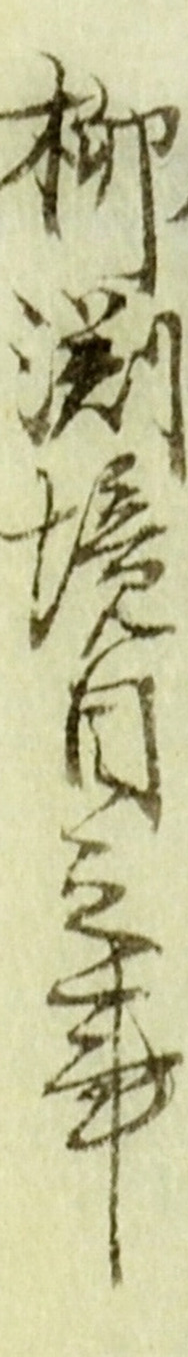柳渕境目之事
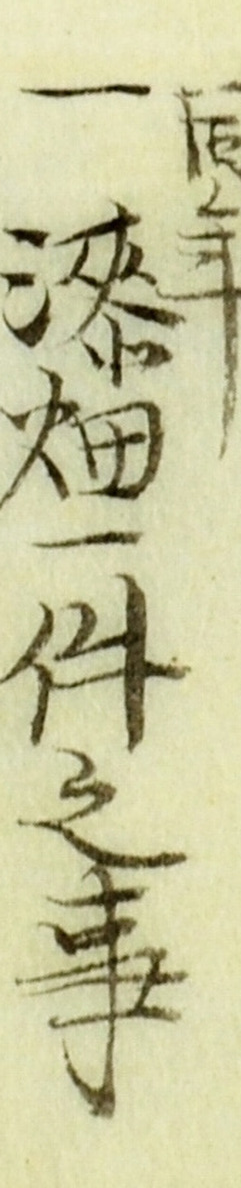一漆畑一件之事
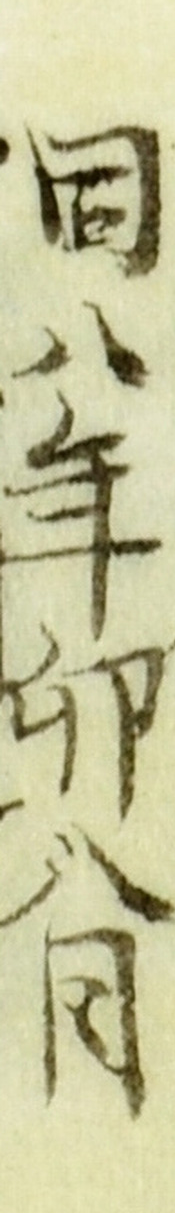同八年卯八月
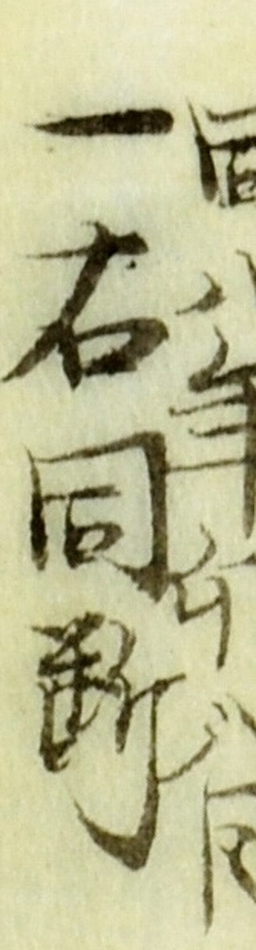一右同断
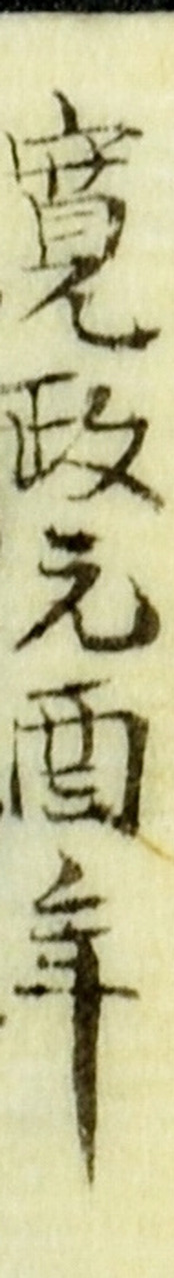寛政元酉年
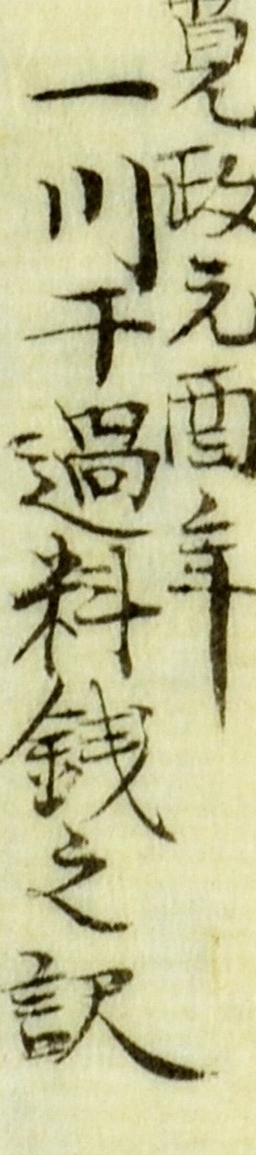一川干過料銭之訳
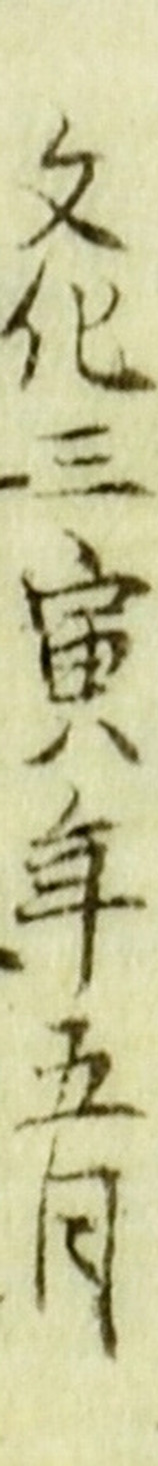文化三寅年五月
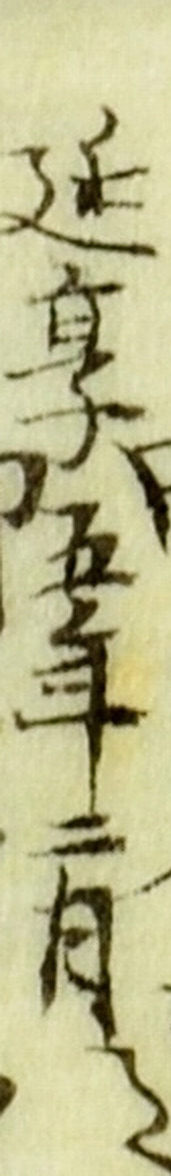延享五年二月
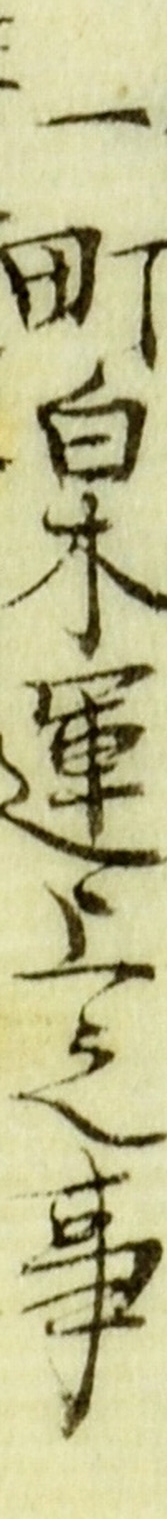一町白木運上之事
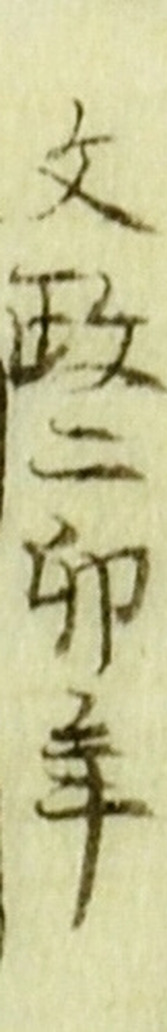文政二卯年
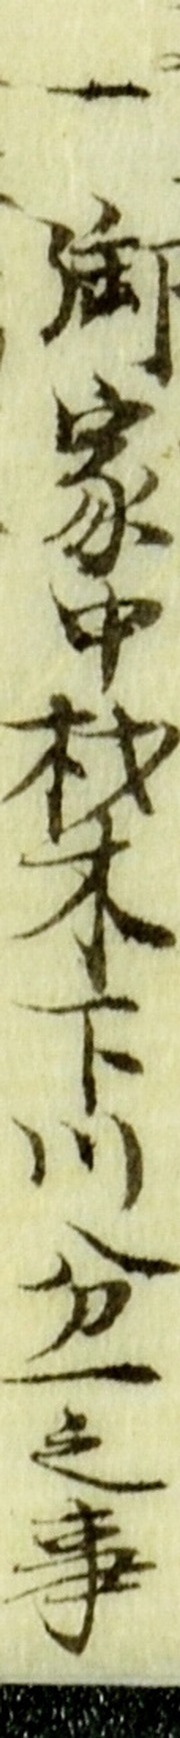一御家中材木下川分一之事
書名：分一御定法
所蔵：伊那市立高遠町図書館・合同会社AMANE
